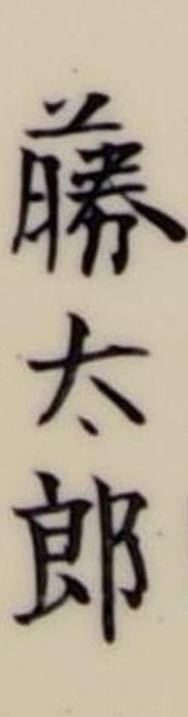藤太郎
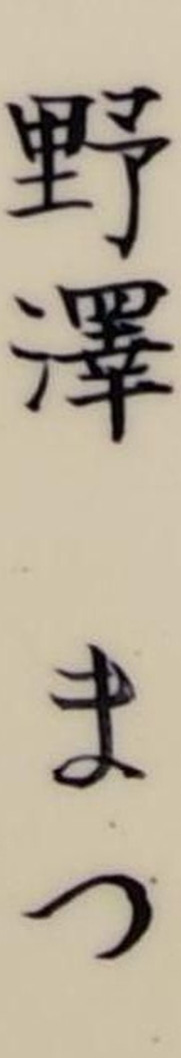野沢まつ
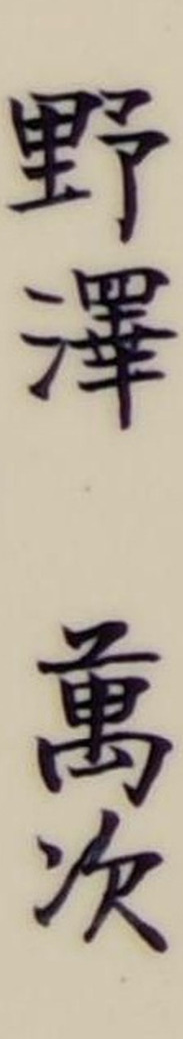野澤萬次
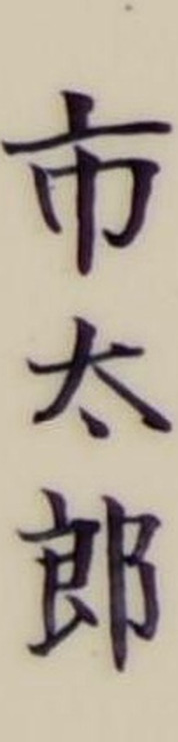市太郎

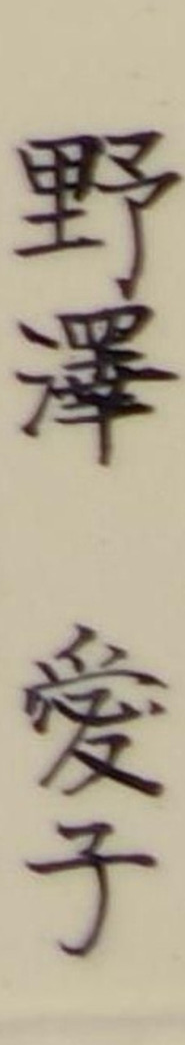野沢愛子
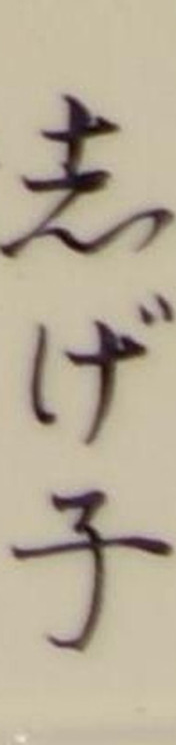しげ子
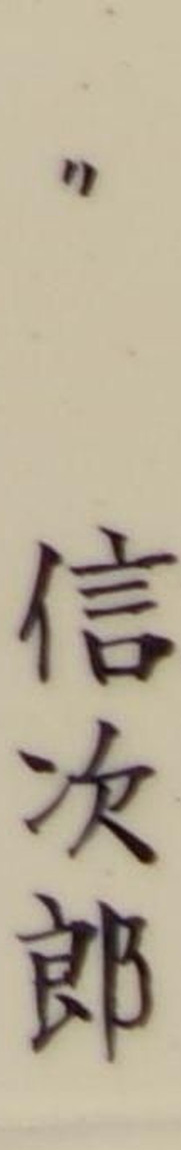信次郎
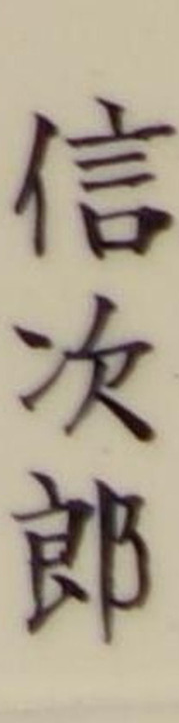信次郎
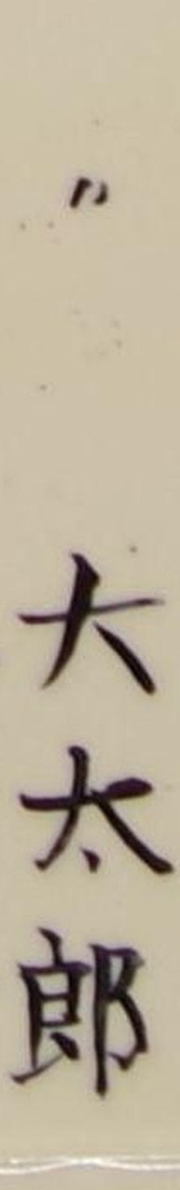大太郎
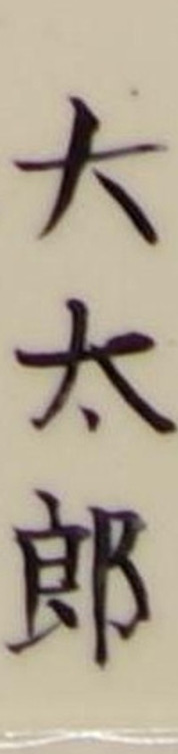大太郎
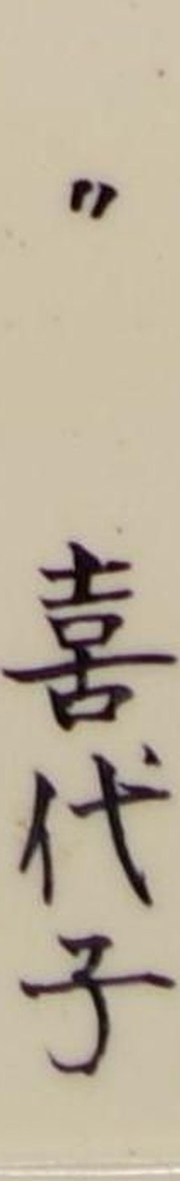喜代子
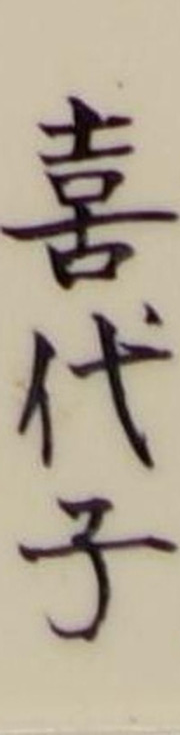喜代子
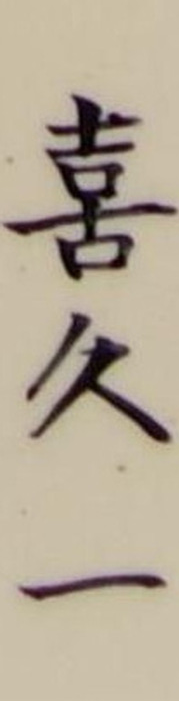喜久一
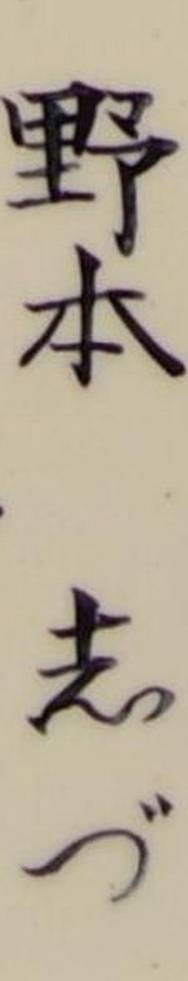野本しづ
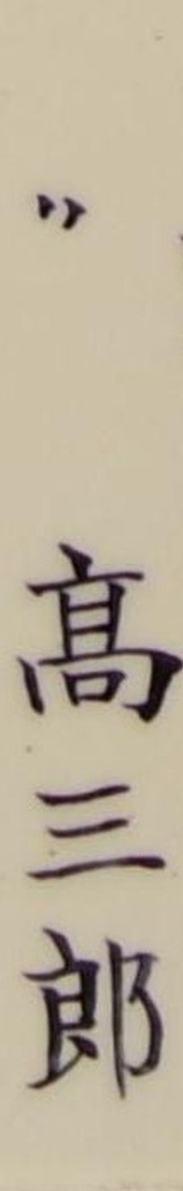高三郎
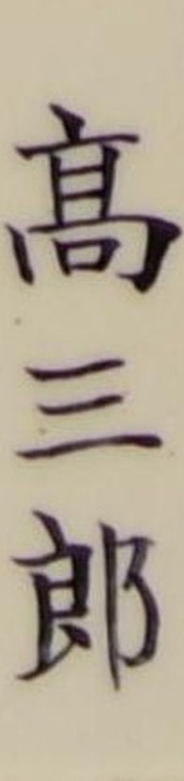高三郎
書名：A~D
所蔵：koyasan kongobuji
